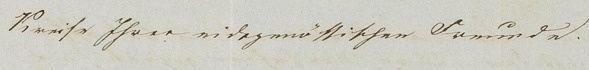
Kreise Ihrer eidgenössischen Freunde.
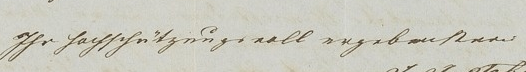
Ihr hochschätzungsvoll ergebenster
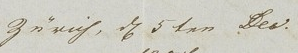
Zürich, den 5ten Dec.
